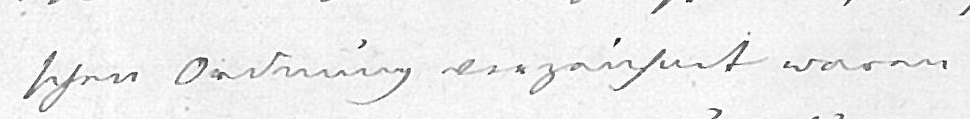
schen Ordnung verzeichnet waren.
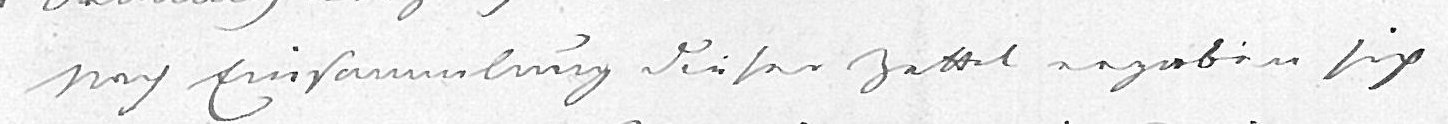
Nach Einsammlung dieser Zettel ergaben sich
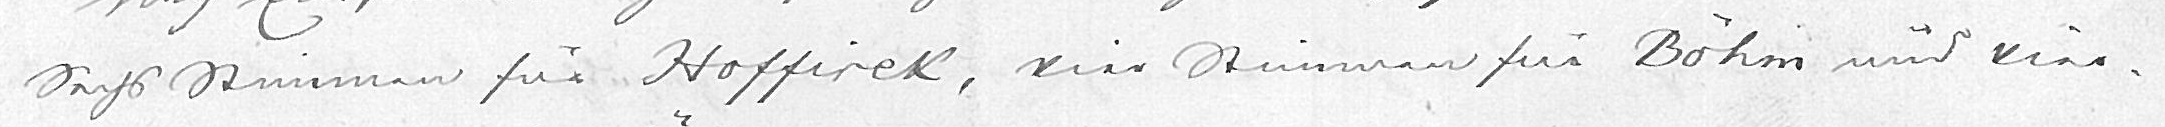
Sechs Stimmen für Hoffirek, vier Stimmen für Böhm und vier
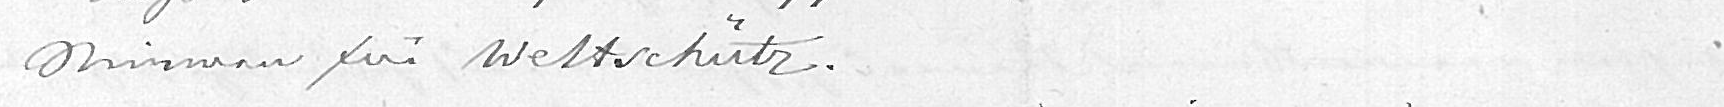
Stimmen für Weltschütz.
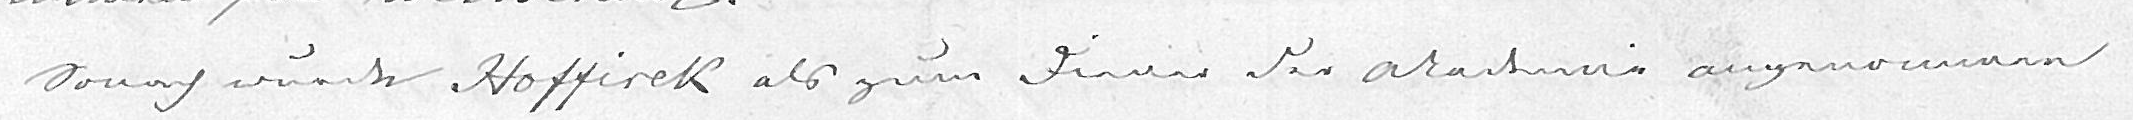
Sonach wurde Hoffirek als zum Diener der Akademie angekommen
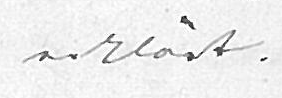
erklärt.
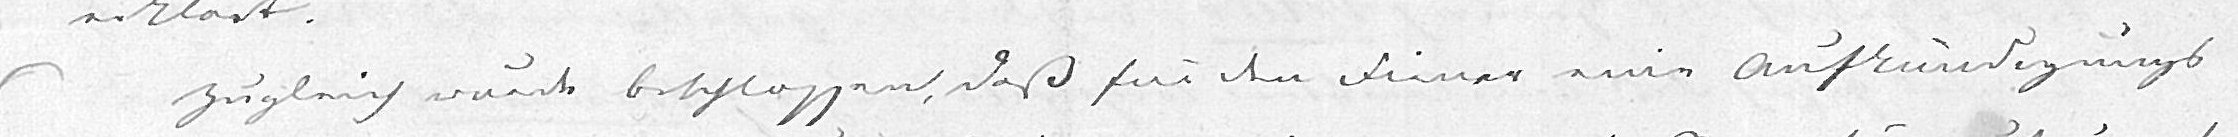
Zugleich wurde beschlossen, daß für den Diener eine Aufkündigungs-
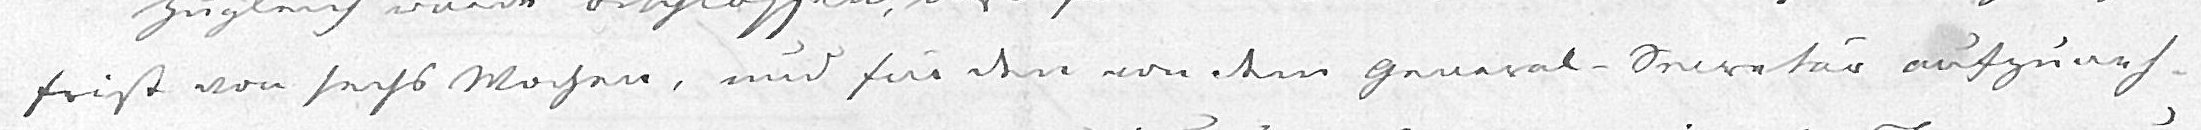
frist von sechs Wochen, und für den von dem General-Secretär aufzuneh-
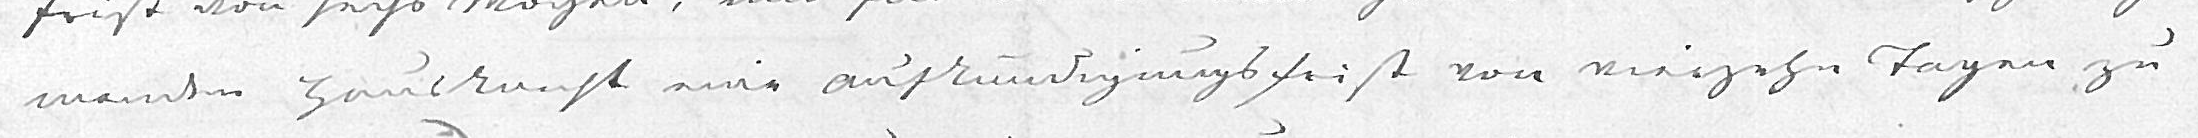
menden Hausknecht eine Aufkündigungsfrist von vierzehn Tagen zu
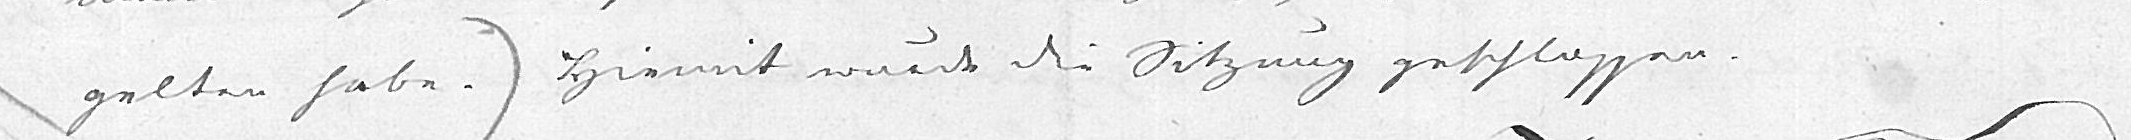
gelten habe. Hiemit wurde die Sitzung geschlossen.
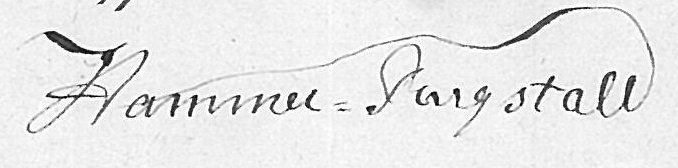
Hammer-Purgstall
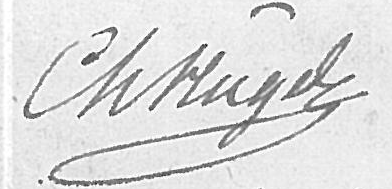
CHHügel
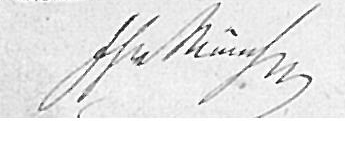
FhvMünch
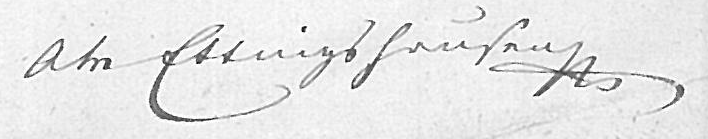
Avn Ettingshausen
